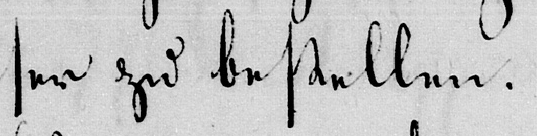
ser zu bestellen.
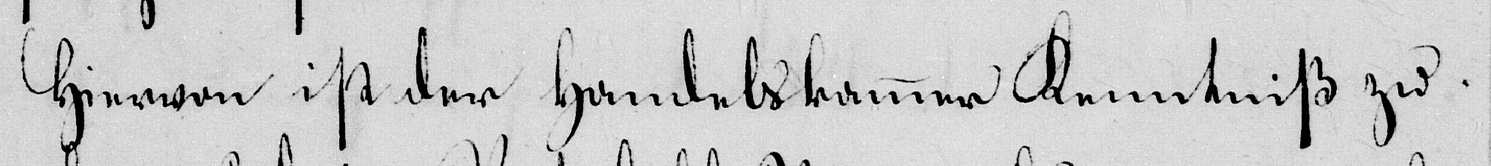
Hiervon ist der Handelskammer Kenntniß zu
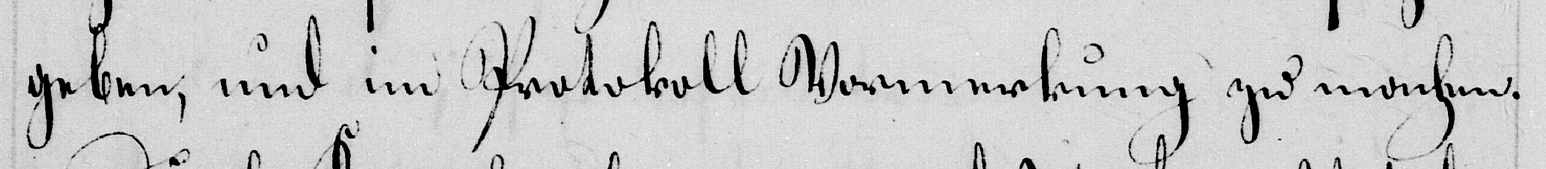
geben, und im Protokoll Vormerkung zu machen.
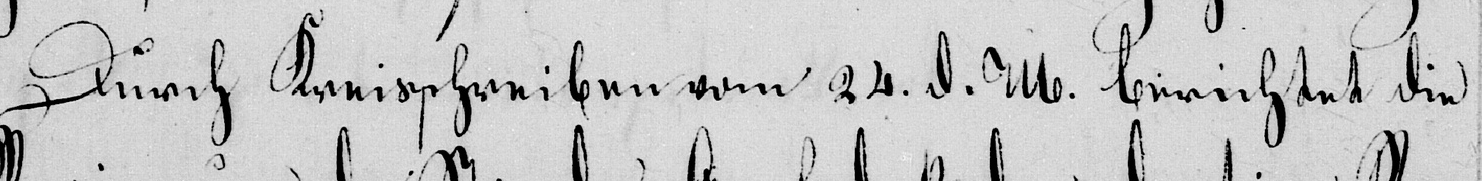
Durch Kreisschreiben vom 24. d. M. berichtet die
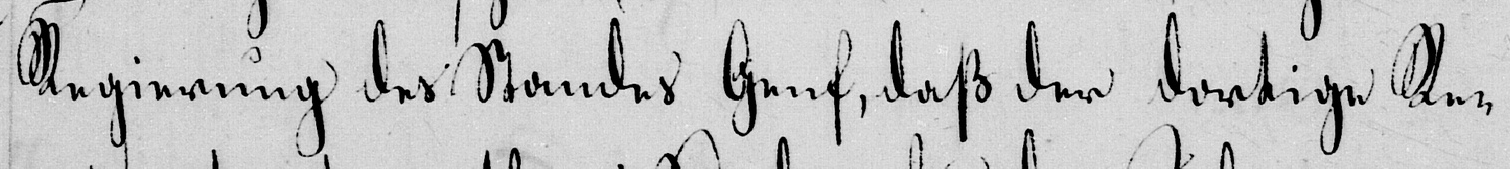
Regierung des Standes Genf, daß der dortige Re¬
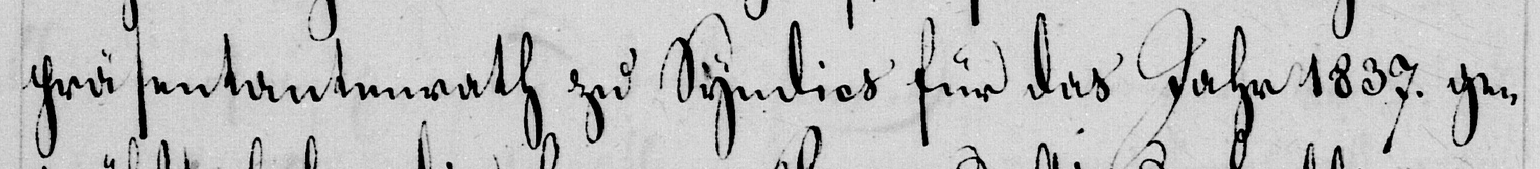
präsentantenrath zu Syndics für das Jahr 1837. ge¬
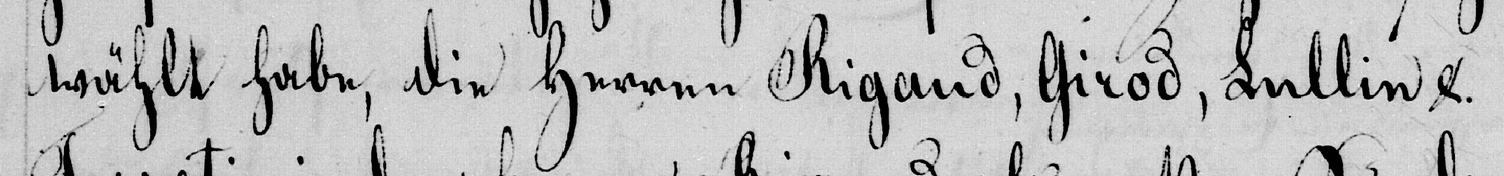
wählt habe, die Herren Rigaud, Girod, Lullin &.
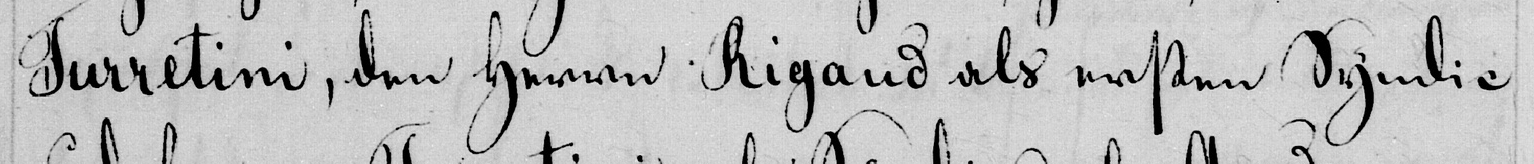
Jurretini, den Herrn Rigaud als ersten Syndic
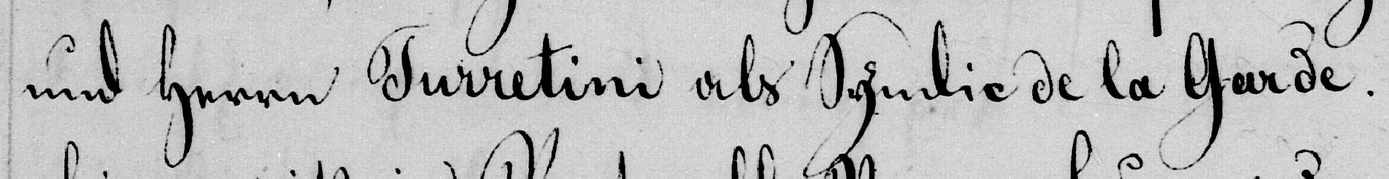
und Herrn Jurretinin als Syndic de la Garde.
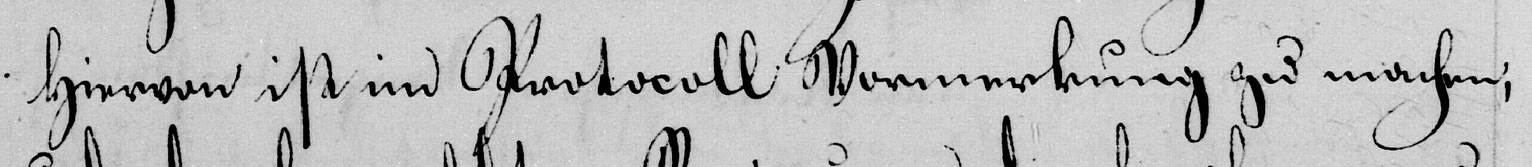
Hiervon ist im Protokoll Vormerkung zu machen;
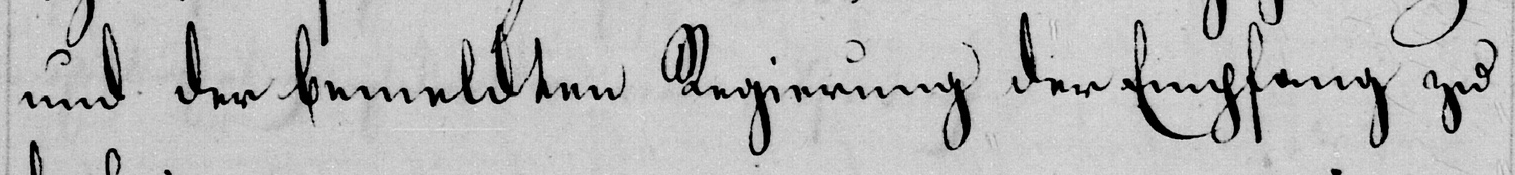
und der bemeldeten Regierung der Empfang zu
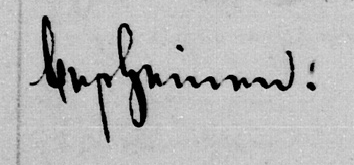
bescheinen.
